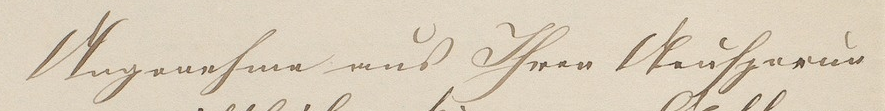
Angenehme und Ihren Aeuszerun-
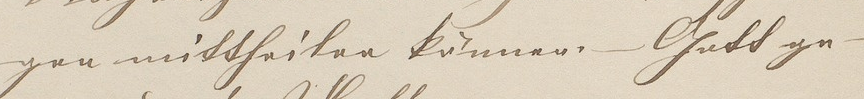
gen mittheilen können. – Gott ge-
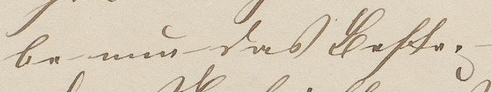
be nun das Beste.
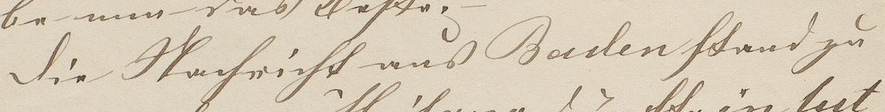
Die Nachricht aus Baden stand zu
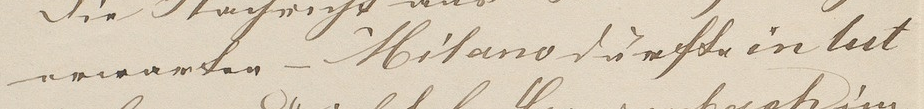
erwarten – Milano durfte in tut-
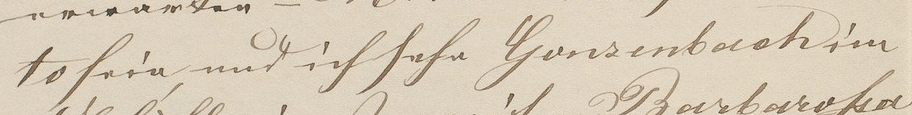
to sein, und ich sehe Gonzenbach im
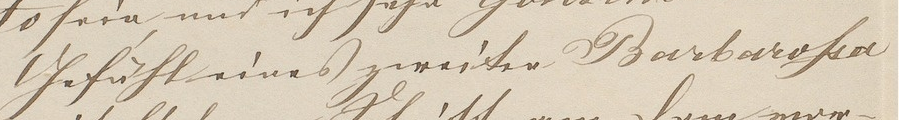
Gefühl eines zweiten Barbarossa
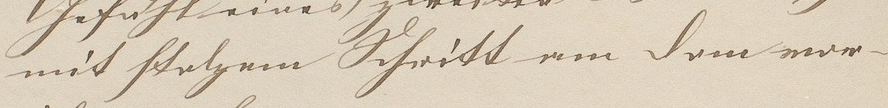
mit stolzem Schritt am dem vor-
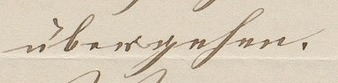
übergehen.
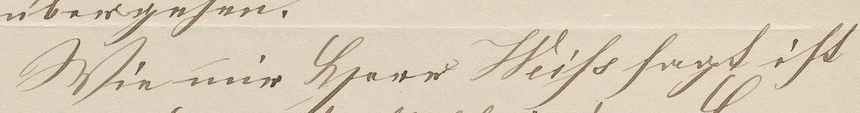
Wie mir Herr Weiss sagt ist
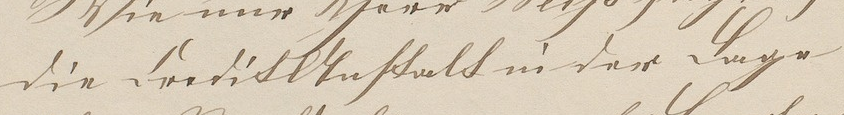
die CreditAnstalt in der Lage
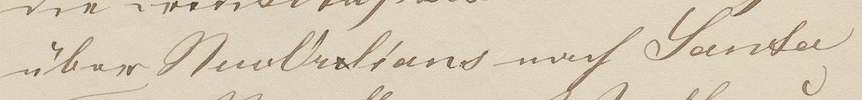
über NewOrrléans nach Santa
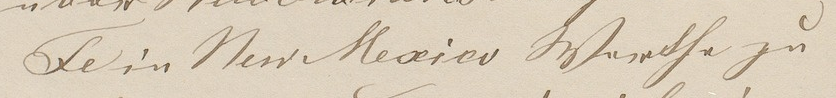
Fe in New Mexico Werthe zu
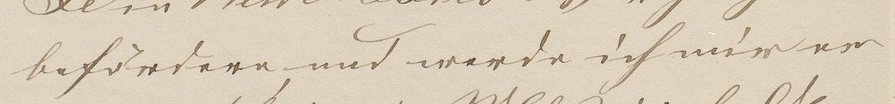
befördern und werde ich mir er-
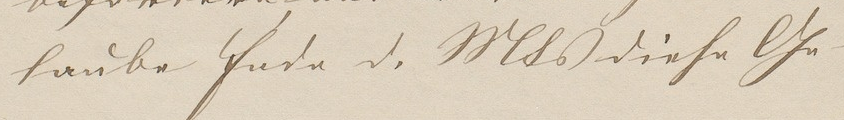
laube Ende d. Mts diese Ge-
